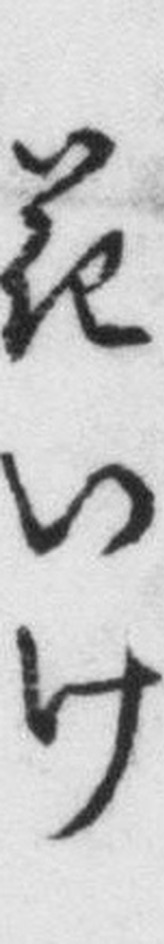花いけ
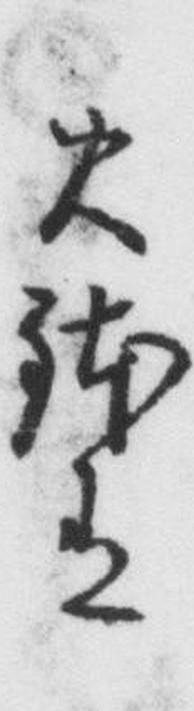火鉢有
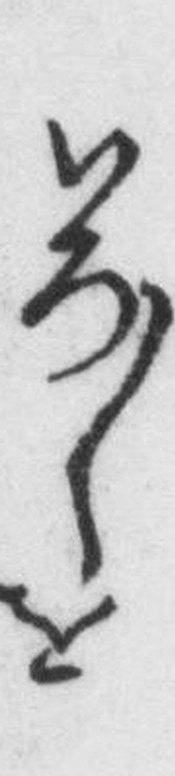いろ〳〵を

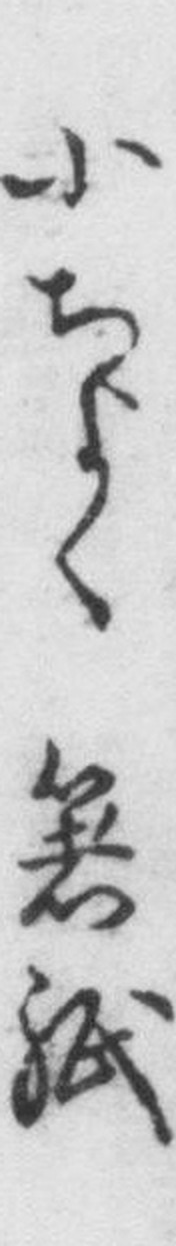小ちよく箸紙
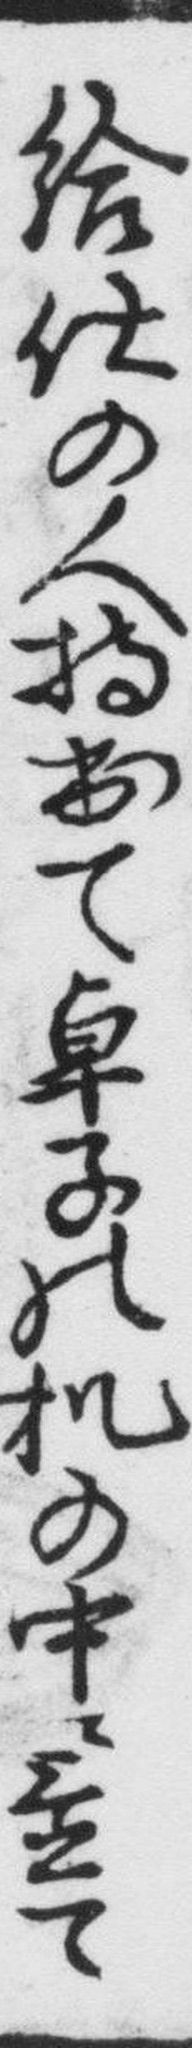給仕の人持出て卓子能机の中に置て

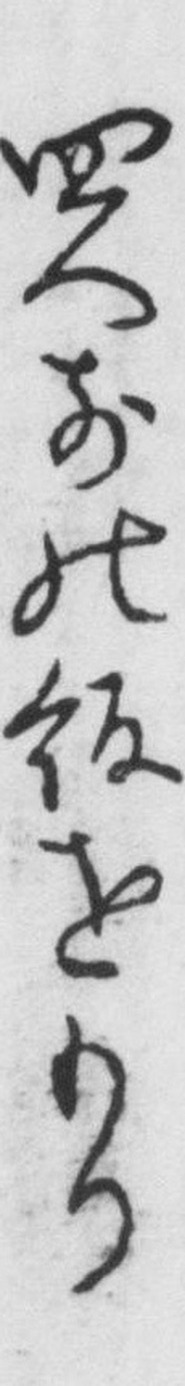四人前能飯をもり
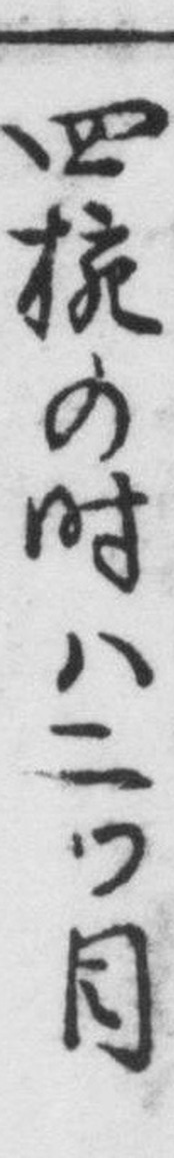六椀の時は三ツ目
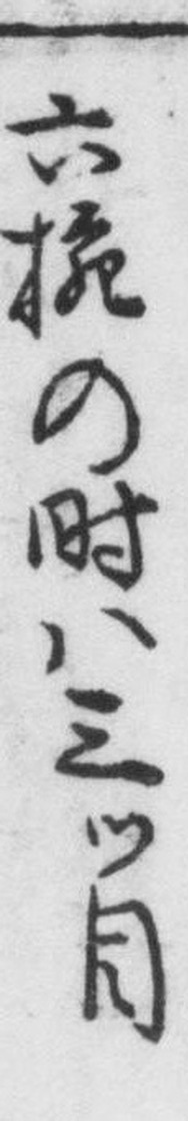六椀の時は三ツ目
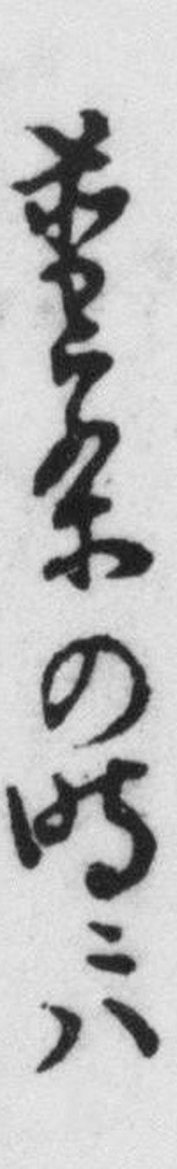普茶の時には
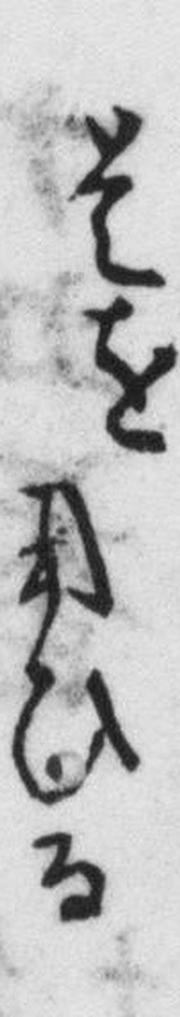是を用ひる

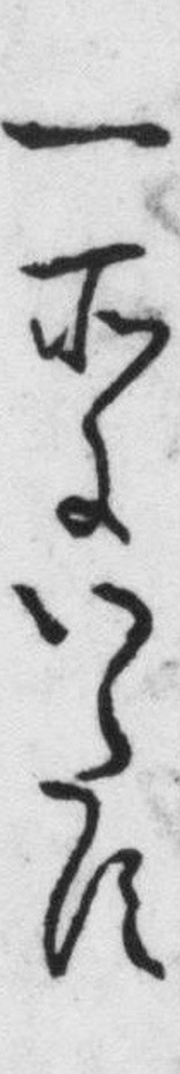一所尓いた須
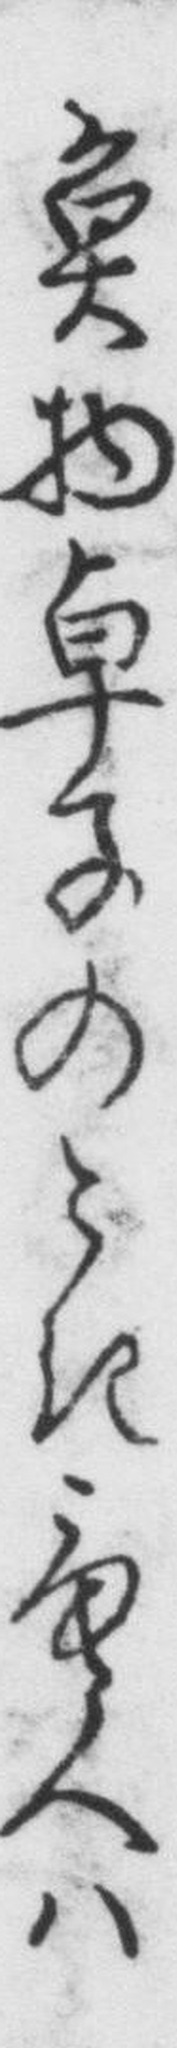魚物卓子のと記唐人は
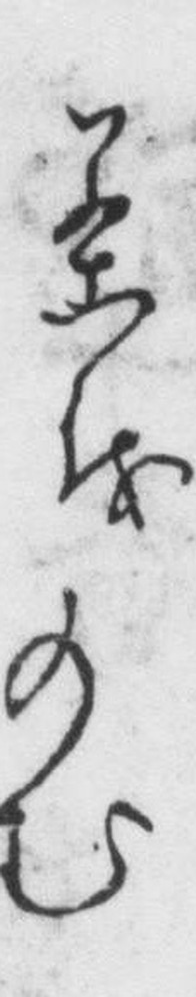茶越のむ

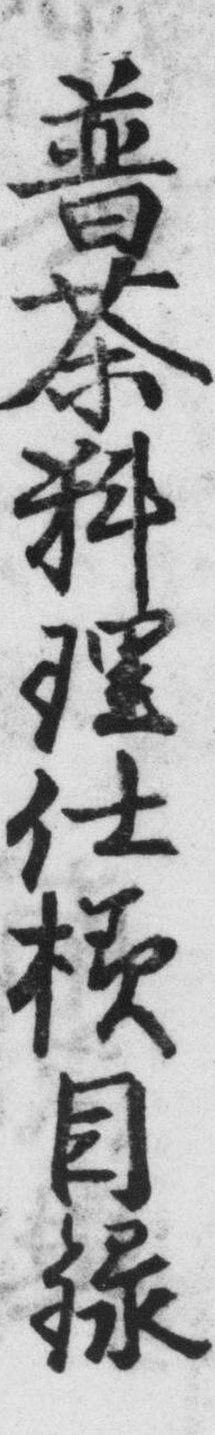普茶料理仕様目録

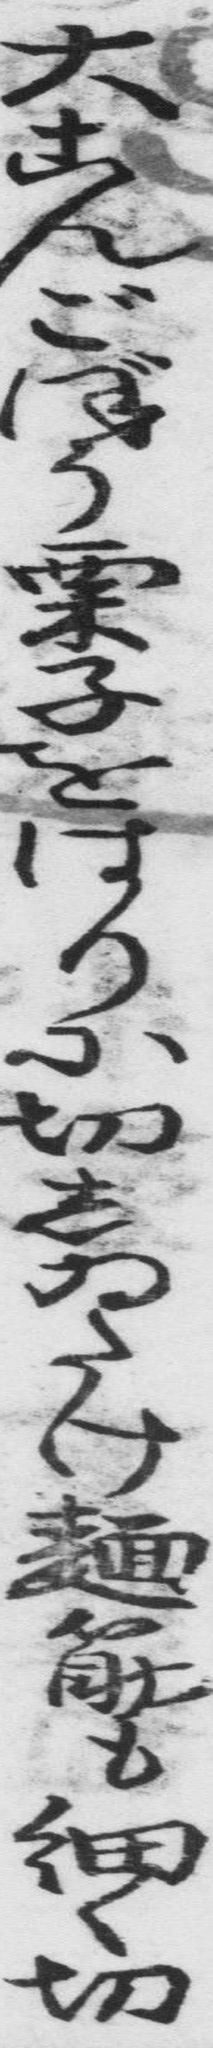大古んごぼう栗子をはり尓切志ゐたけ麺筋も細く切
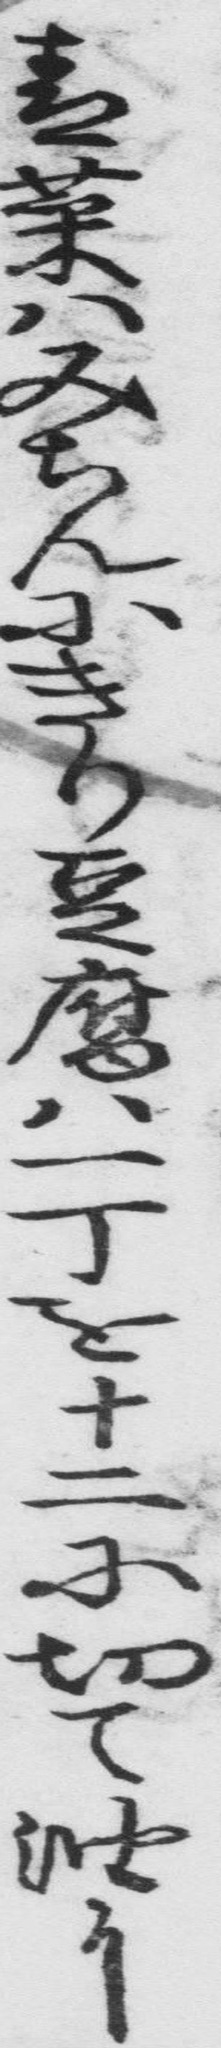青菜はみちん尓きり豆腐は一丁を十二尓切て油耳
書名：普茶料理抄
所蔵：大阪府立大学学術情報センター 国文学研究資料館
